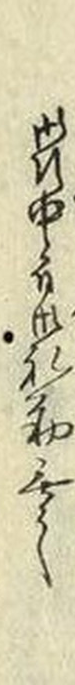御引中ニ付御礼勤無之
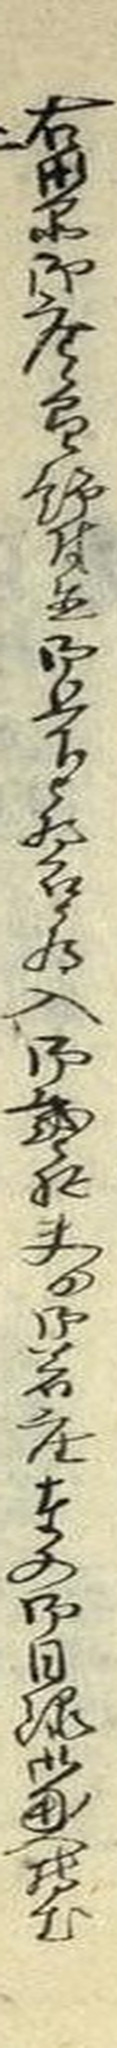右御品御座間飾付置御上下被為召被為入御戴被遊夫ゟ御着座奉文御目録御用人持出
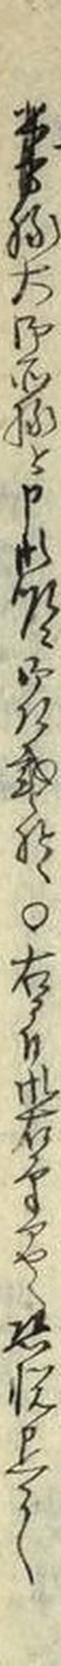上様大御所様と申御順ニ御頂戴被遊候〇右ニ付御右筆部屋へ恐悦申上之
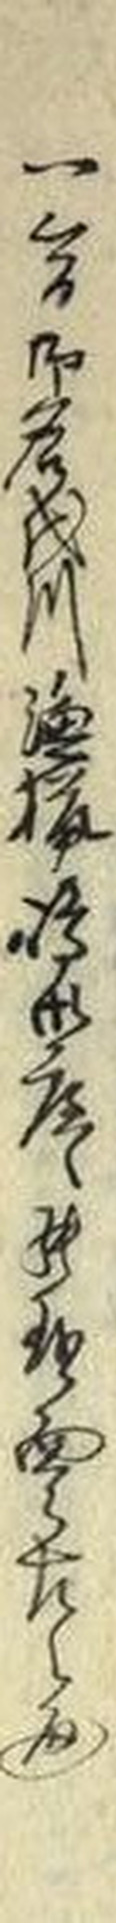一今日御名代川漁猟嶋御庭へ罷越候面々左之通

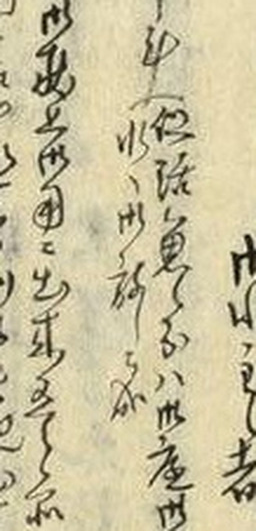水へ御放しニ成
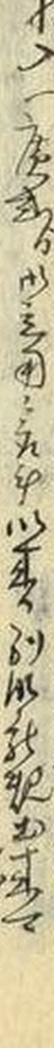広式ゟ御立用ニ取計以来ハ別段新規出来可致事
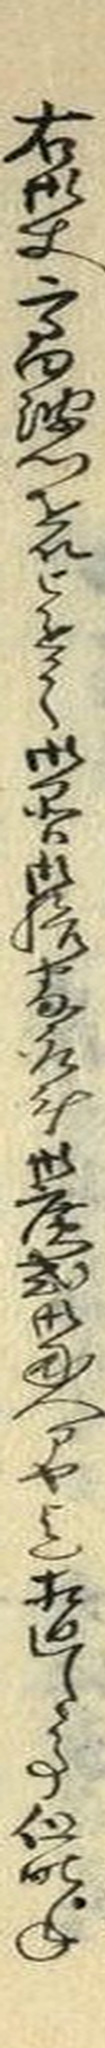右御使高田波門を以被進之御品ハ御膳番取計御広式御用人部屋迄相廻し候事但昨年
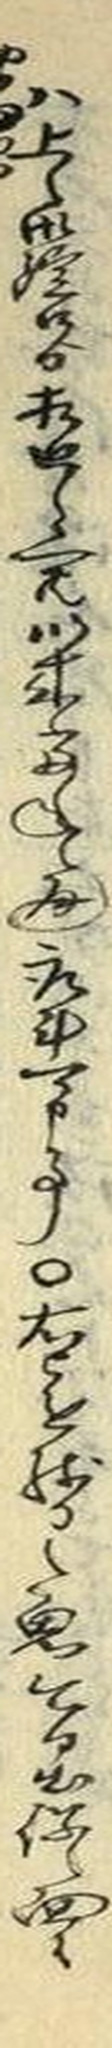ハ上之御錠口ゟ相廻し候へ共以来当年之通取計可申事〇右被進残り之魚今日出役之面々
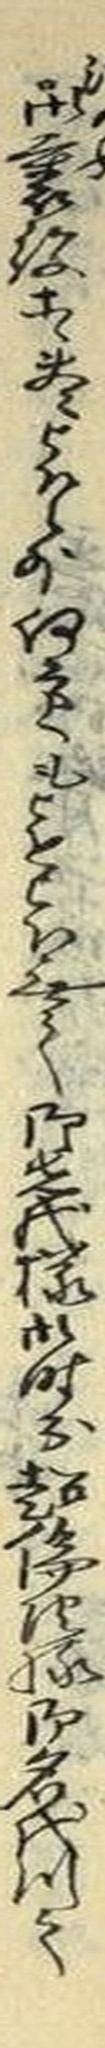波門始御裏役等へ夫々被下候外何方へも被進被下無之御先代様御時分超倫院様御名代川之
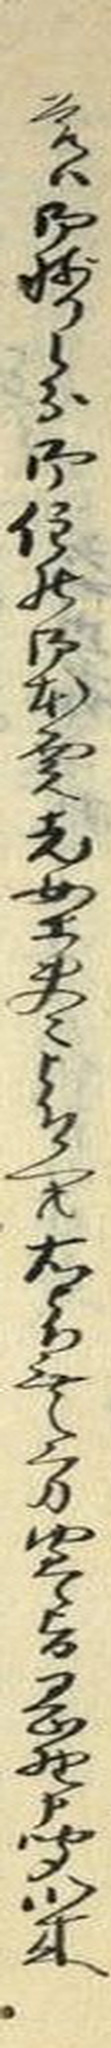節ハ御残り之分御住居御本殿老女等夫々被下候へ共右被下無之方宜候旨岡野申聞以来
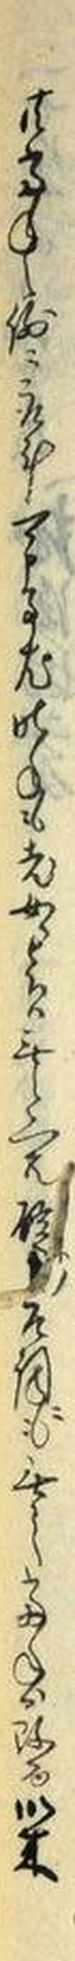者当年之例ニ取計可申事尤昨年も老女へ被下ハ無之候へ共聢未ノ取調ニも無之当年ゟ改而以来
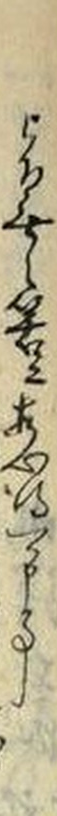被下無之筈ニ相心得可申事
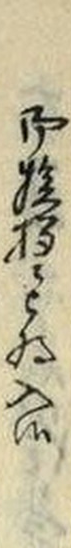御挨拶ニ被為入候
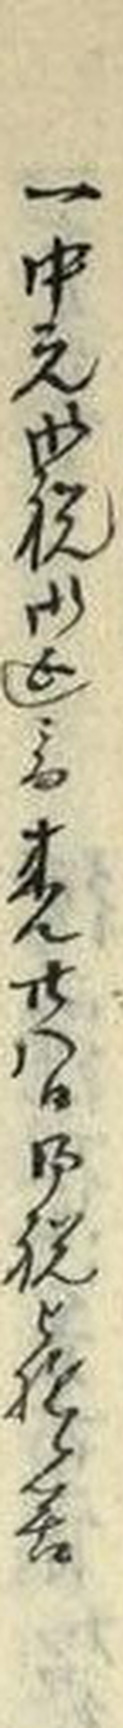一中元御祝御延ニ而来ル廿八日御祝被遊候筈
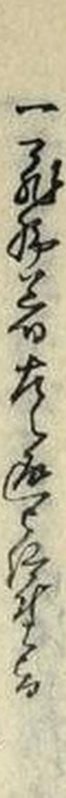一飛脚着左之通被仰付候旨
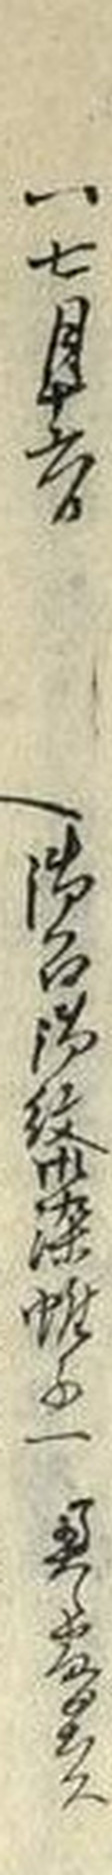一七月十六日御召御紋御染帷子一奥之番ゟ出ス
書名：少傅日録抄（斉善付側向頭取日記、在府）
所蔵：福井県文書館 Fukui Prefectural Archives
